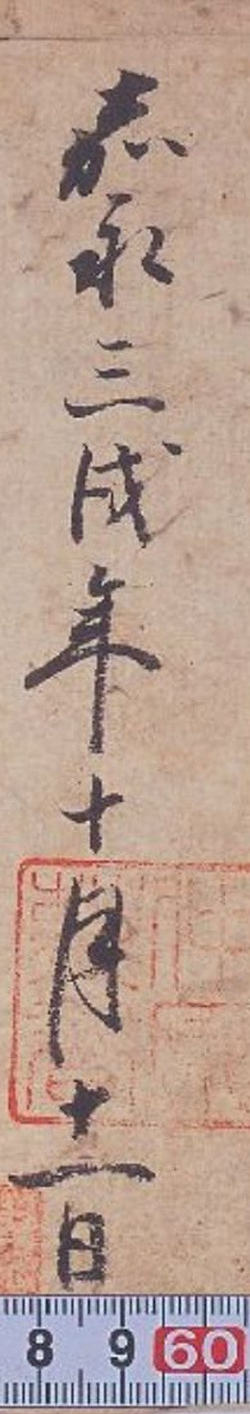嘉永三戌年十月十一日
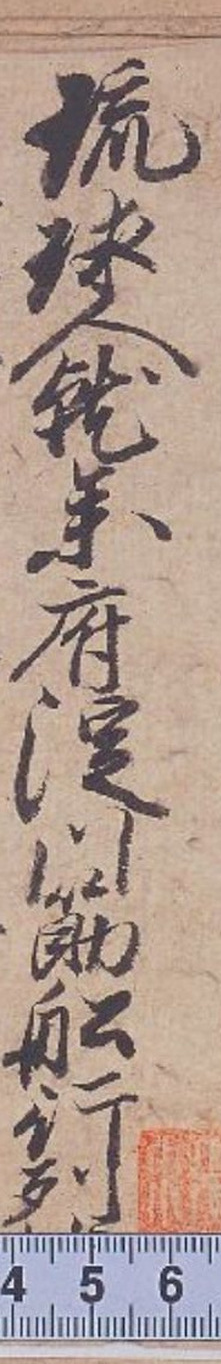琉球人就参府淀川筋船行列
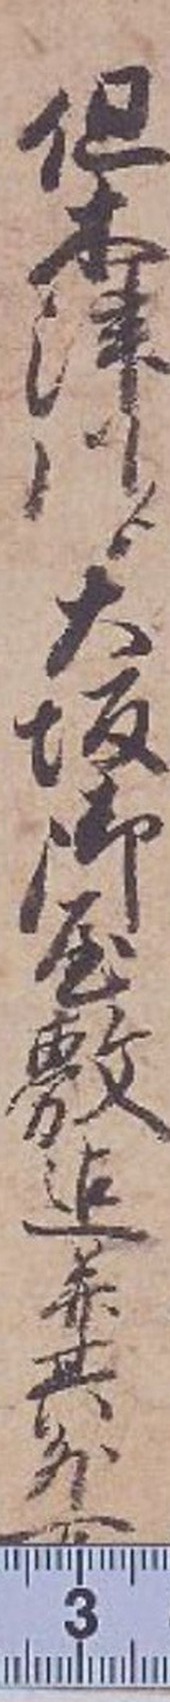但木津川より大坂御屋敷迄并其外

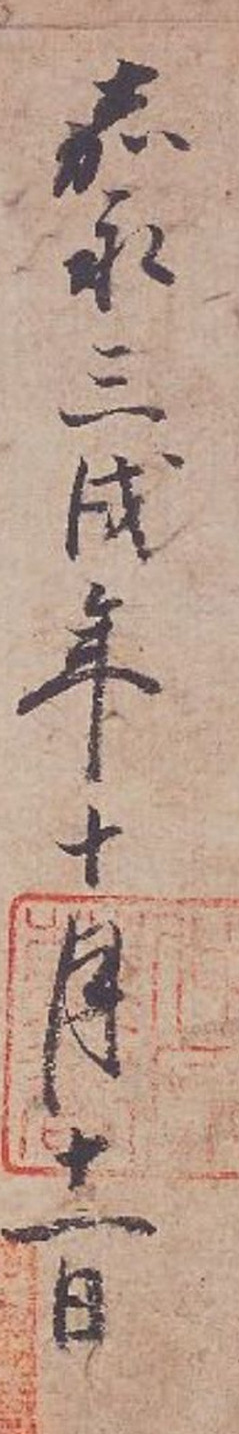嘉永三戌年十月十一日
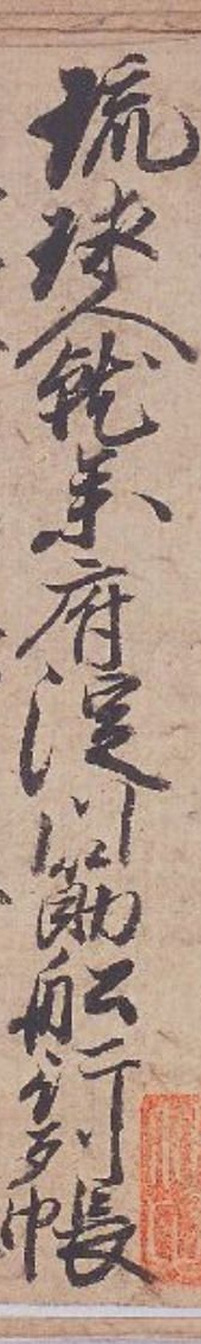琉球人就参府淀川筋船行列帳
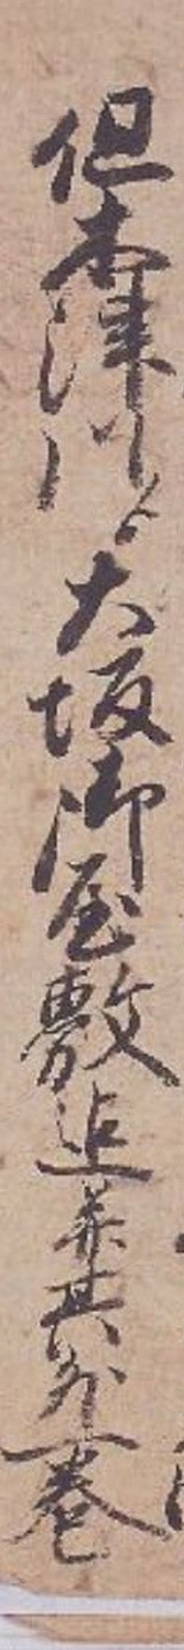但木津川ゟ大坂御屋敷迄并其外一巻

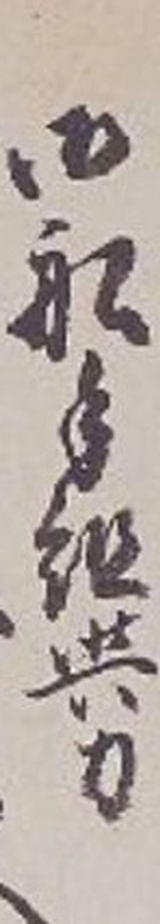御船手組与力
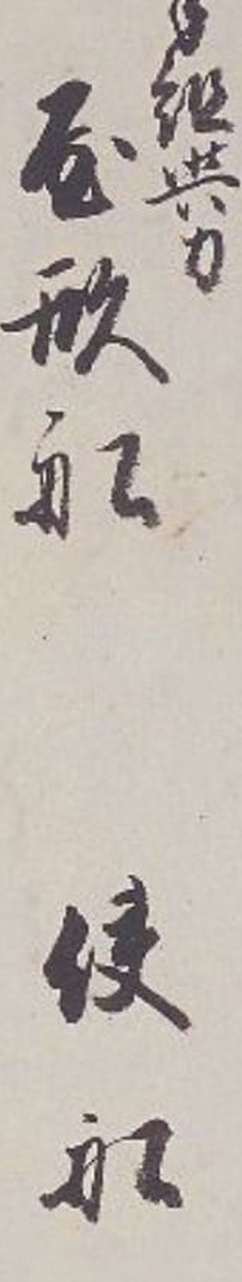屋形船使船
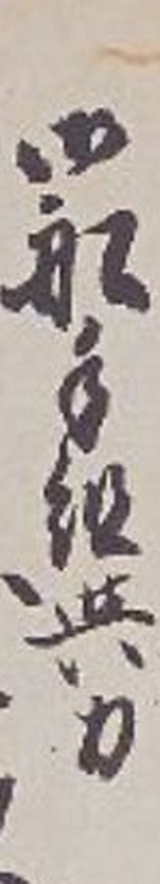御船手組与力
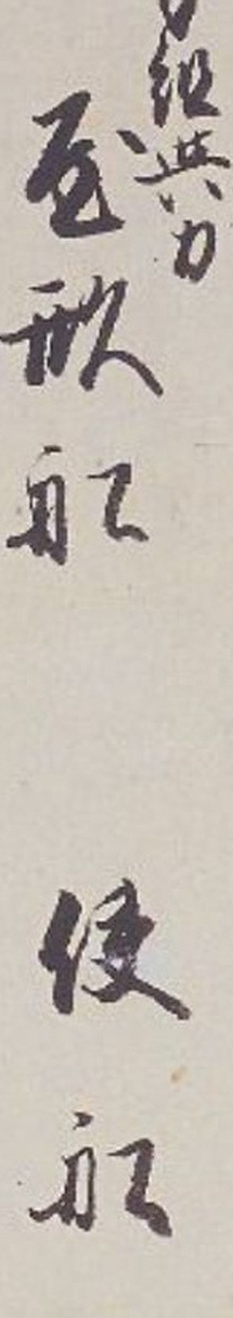屋形船使船

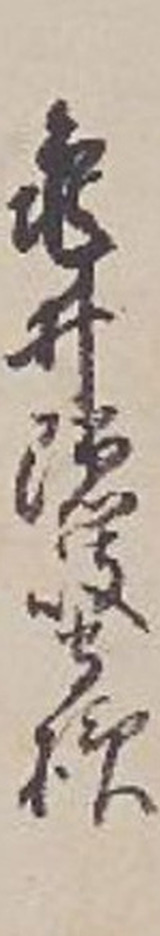亀井隠岐守様
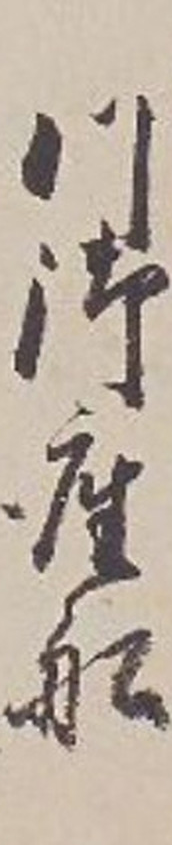川御座船
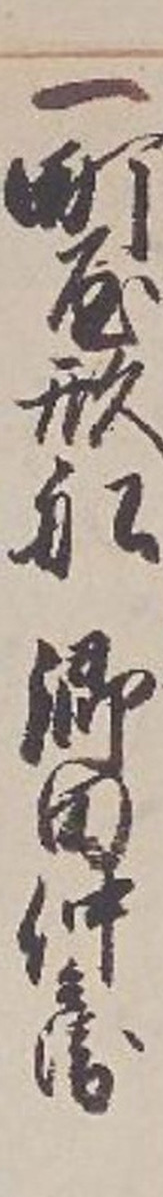一町屋形船郷田仲兵衛
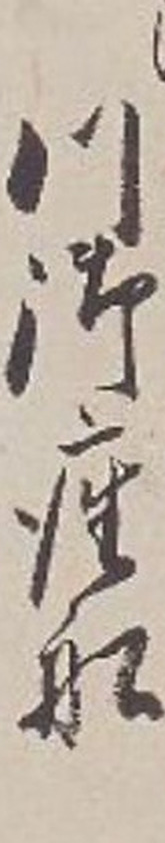川御座船
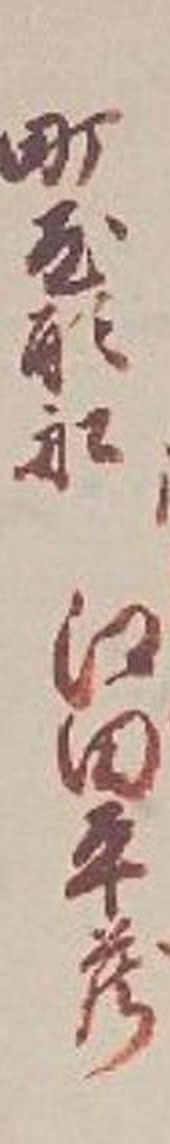町屋形船江田平蔵

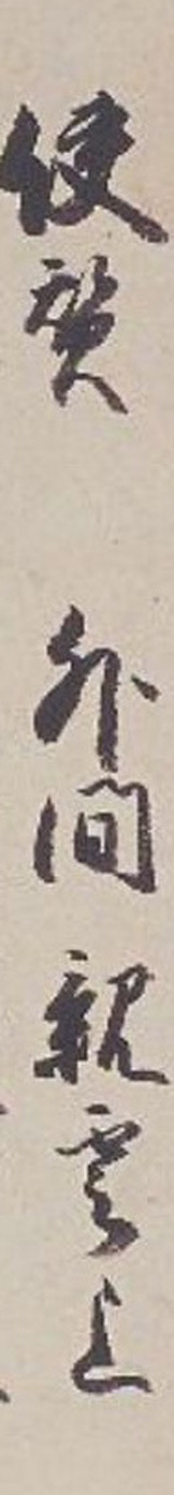使賛外間親雲上
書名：琉球人就来府淀川筋船行列帳 但木津川より大阪御屋敷迄並其外一巻
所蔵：University of the Ryukyus Library
